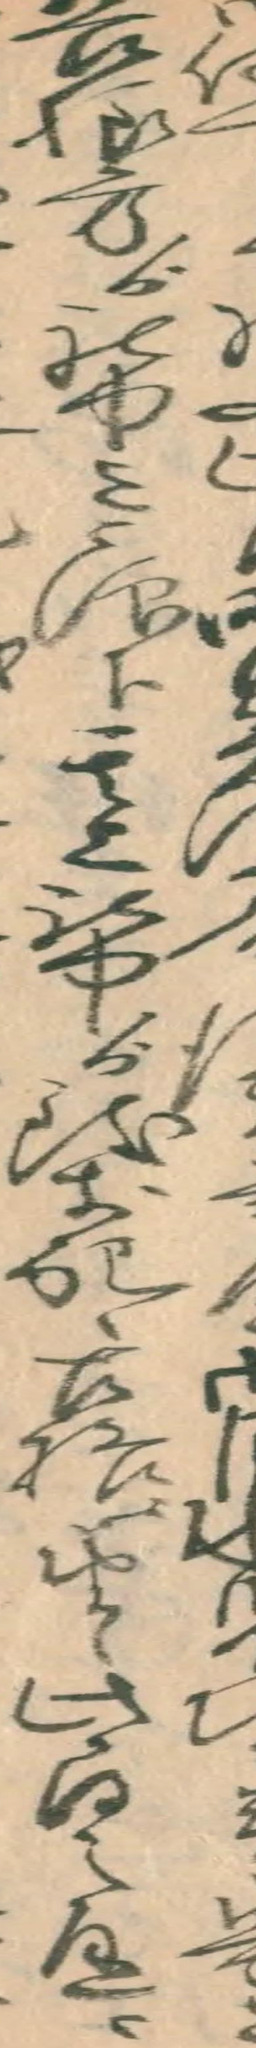谷様方ゟ社中迄被仰下其上社中ゟ致支配候古格ニ御座候此間之通ニ
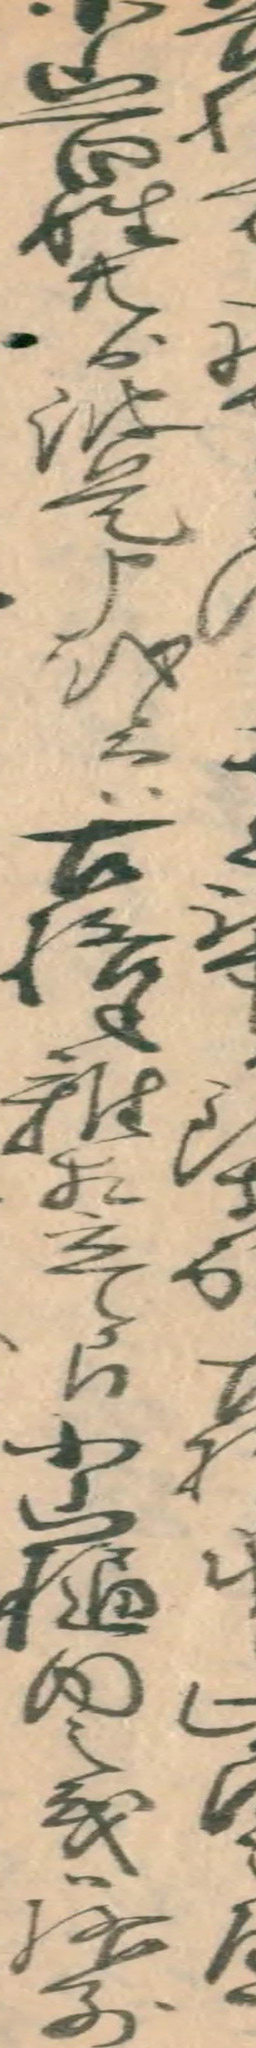小山百姓共ゟ彼是申越候而ハ古格も難相立候間小山樋内之義ハ格別
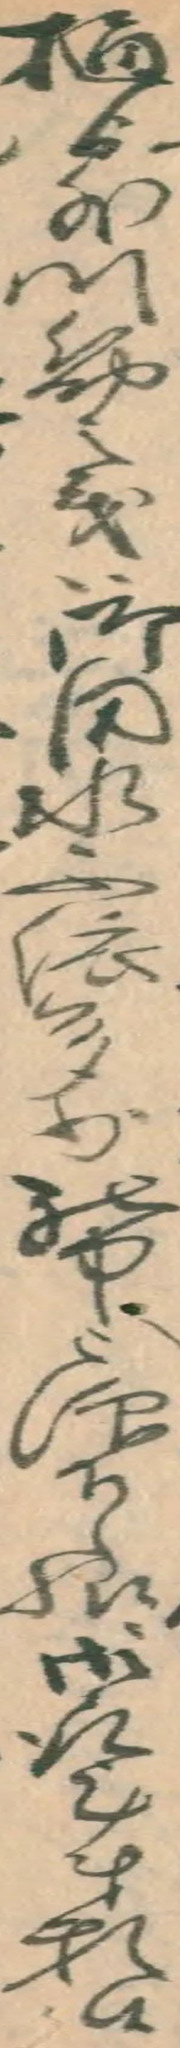樋ゟ外川筋之義ハ御用水不依多少社中へ被仰下候様ニ御取計奉頼候
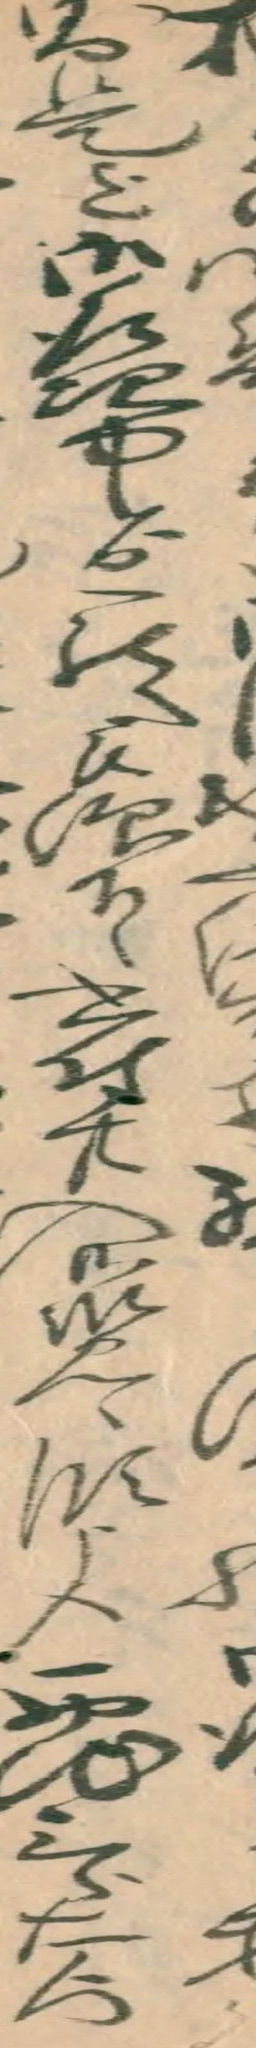則是迄御取次中ゟ一社へ被仰下候書付共入御覧候段申入西池三郎右衛門
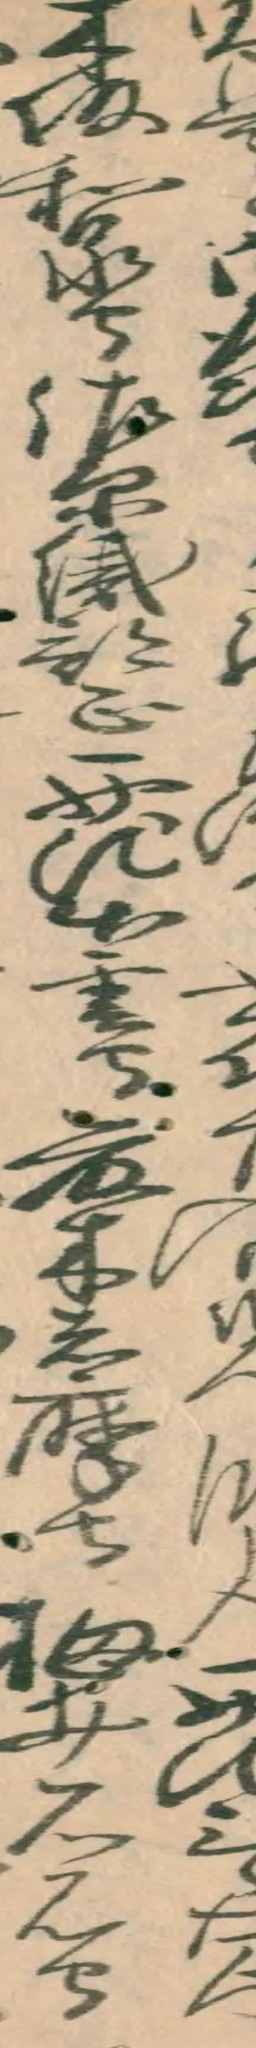木坂和泉守佐原織部正西池出雲守藤木志摩守栂井石見守
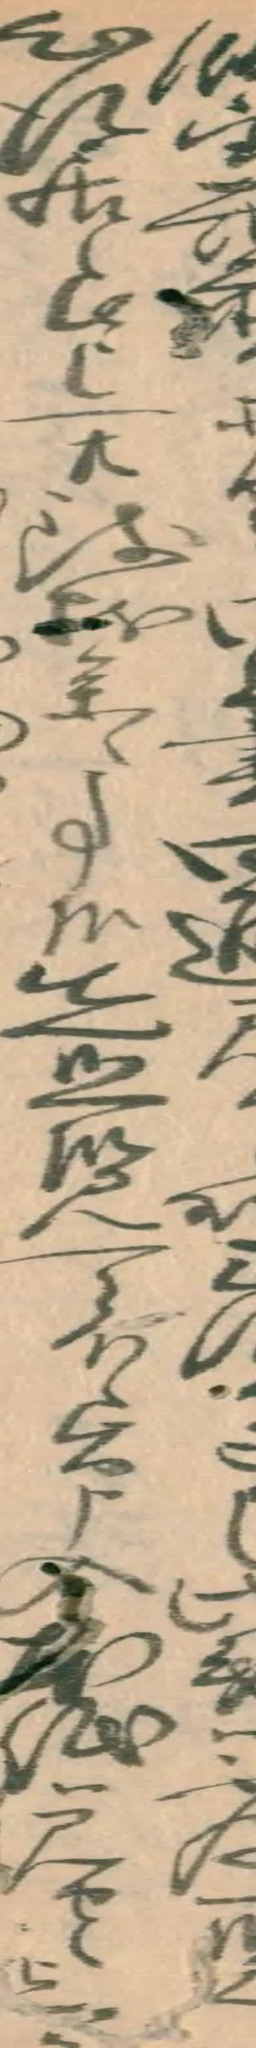心得居候由申候へ共致持参候事故先御一覧可被下候旨申入本紙ハ見せ候迄ニ而
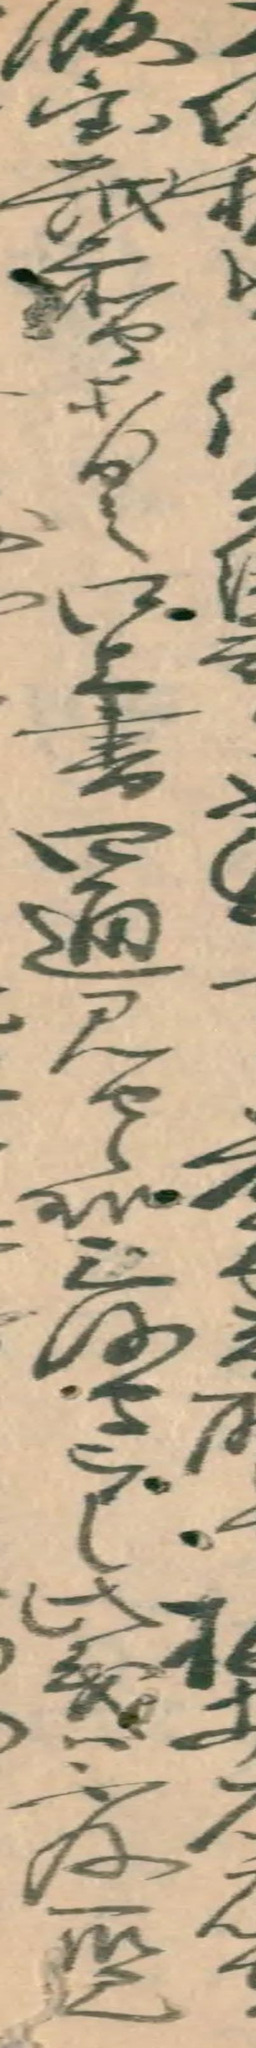飯室越前守等ゟ之口上書四通見せ候処三河守被申候此義ハ不及一覧
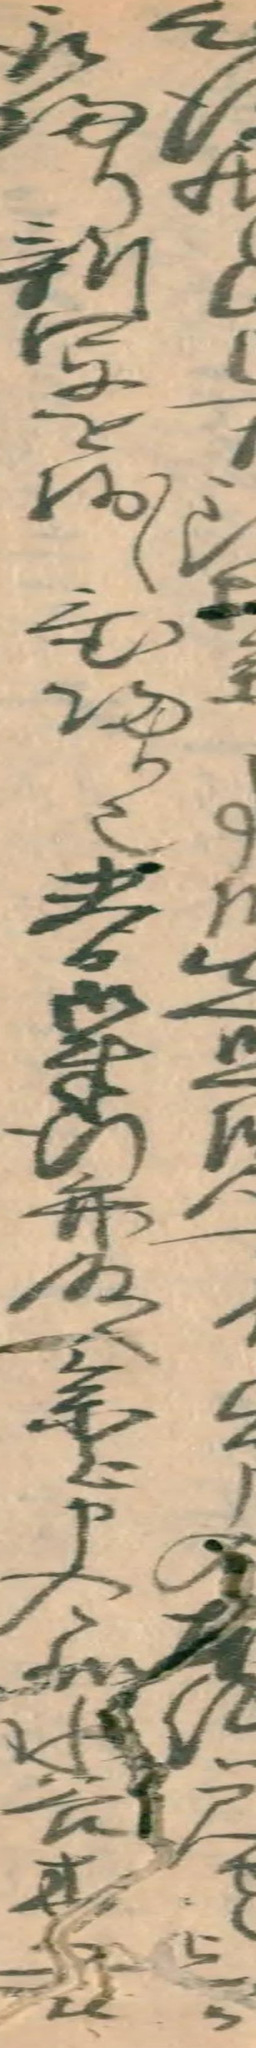取帰り新写を残し置帰り也夫ゟ御奉行弁殿へ参上申入候処水谷木工被
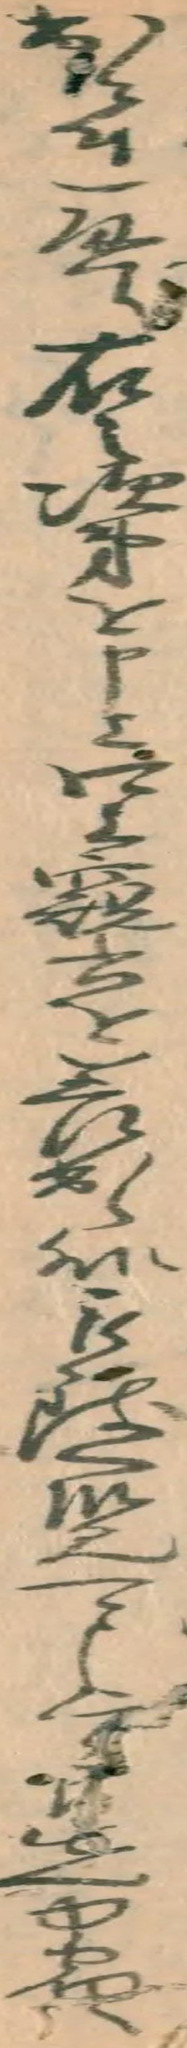出候ニ付一通り右之次第を申上口上窺書を差出候処被致一覧可申上先中宿へ
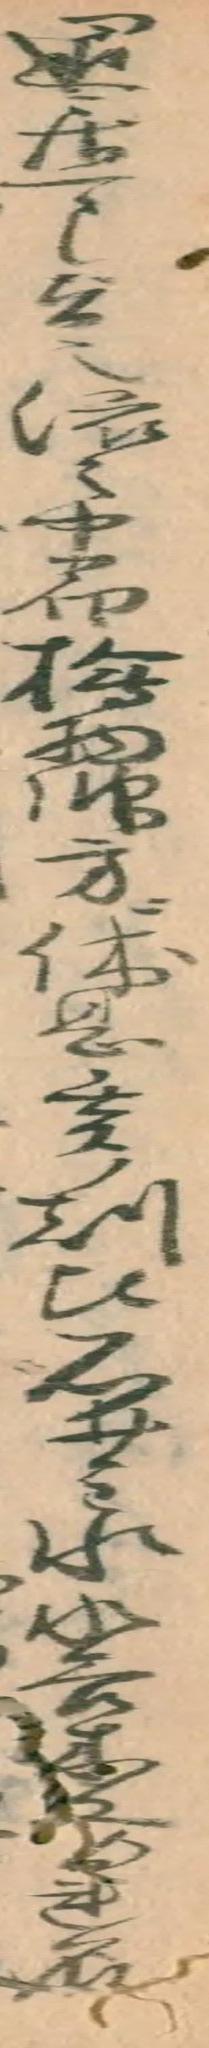退居可申旨也依之中宿檜物師方ニ休息亥ノ刻比石井主水水谷木工ゟ連名
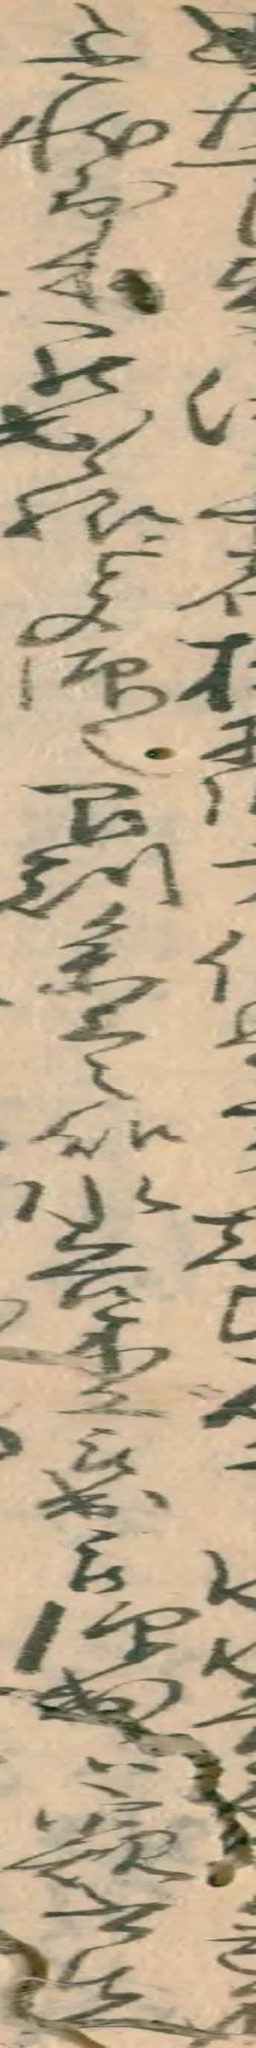之書状到来罷出候様ニとの仰也即刻参上之処水谷木工被出被仰出候ハ窺書先
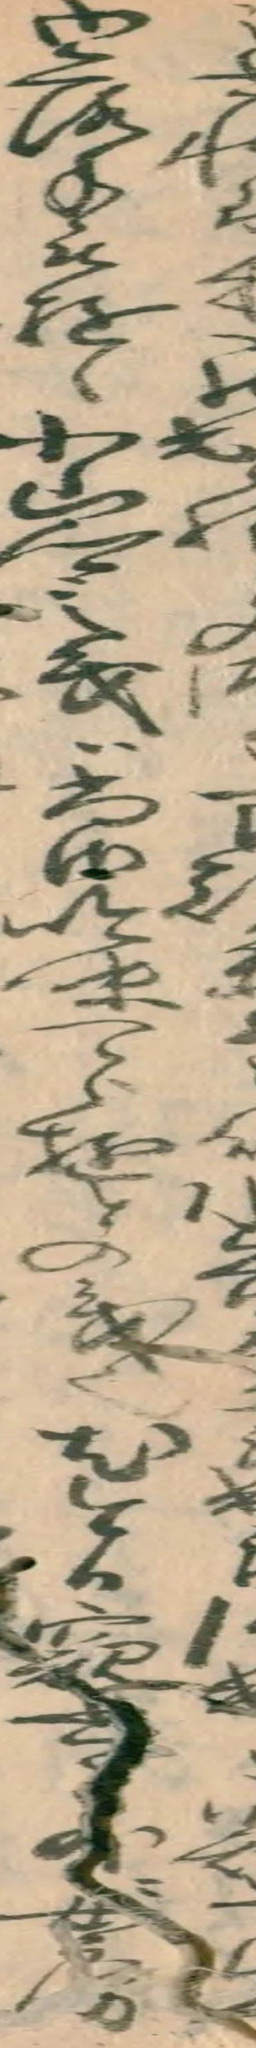御落手被遊候小山郷之義ハ尚御吟味可被遊との義也尤今日窺書之外ニ女房
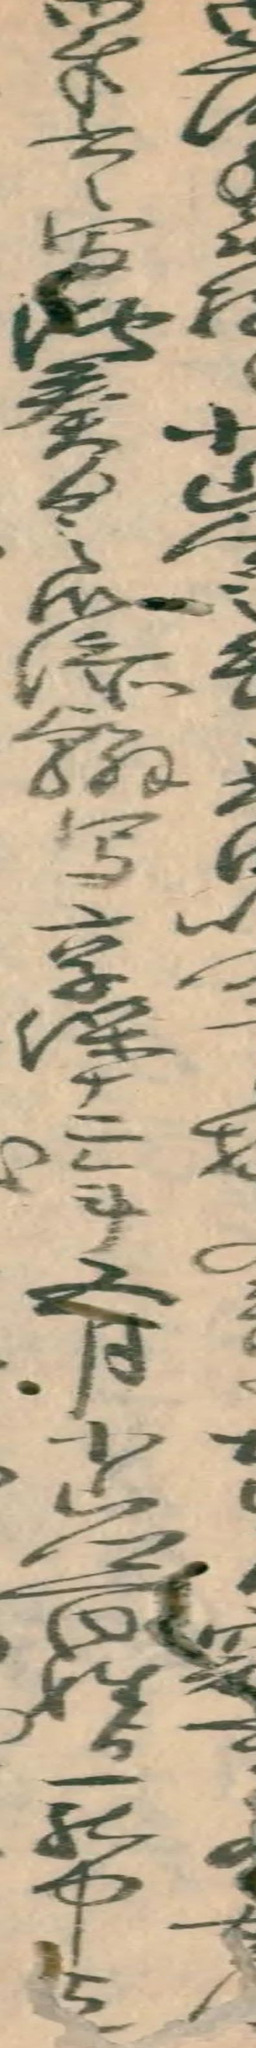御奉書之写伝奏ゟ之御添翰写享保十二年五月小山郷百姓ゟ一社中迄
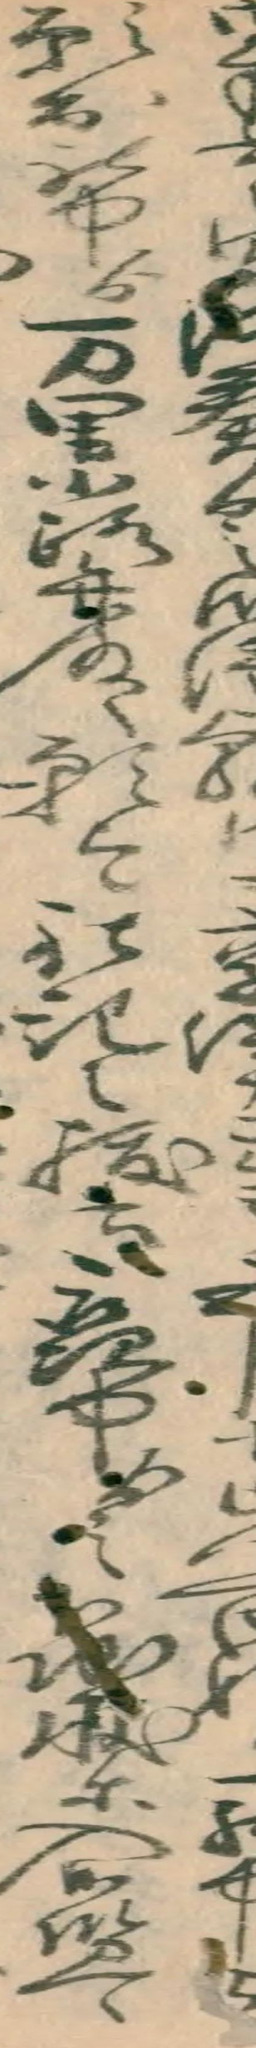願出社中ゟ万里小路弁殿へ願上候社記之抜書取次中ゟ之下地状等入御覧候
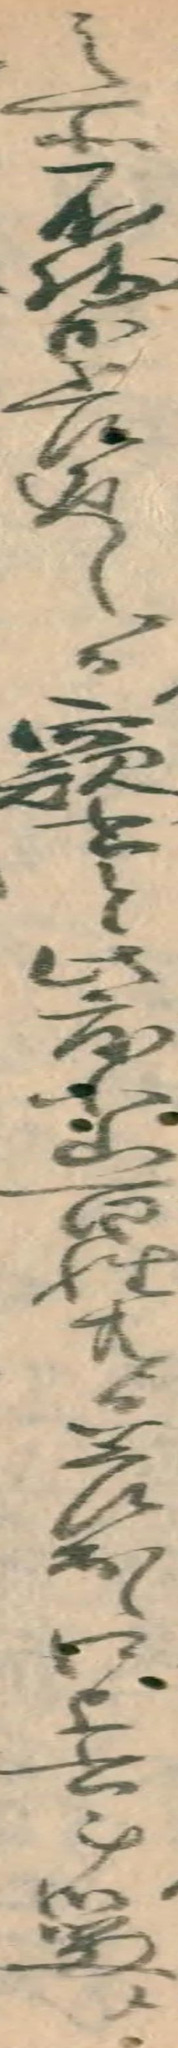之所不残差返しニ而窺書と此度小山百姓共ゟ差出候口上書計御留メ
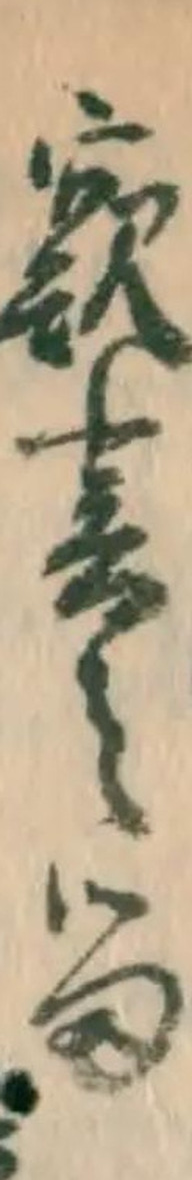窺書之留
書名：賀茂社記録. 第58冊
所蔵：国立国会図書館 National Diet Library, JAPAN
